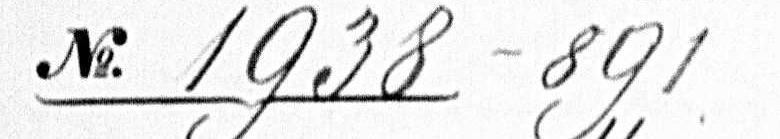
No 1938 – 1891
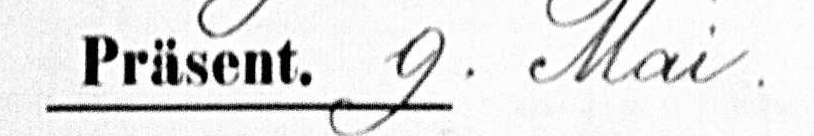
Präsent. – 9. Mai
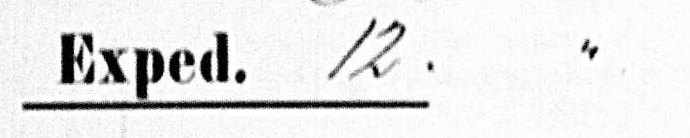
Exped. – 12. „
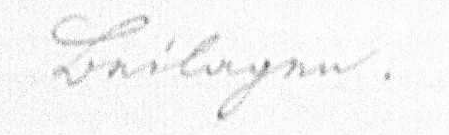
Beilagen
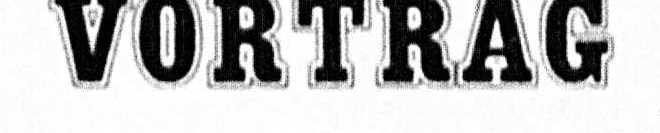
VORTRAG
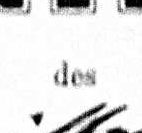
des
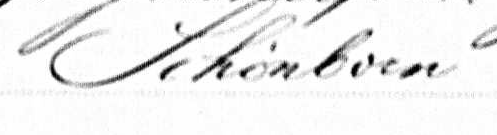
Schönborn
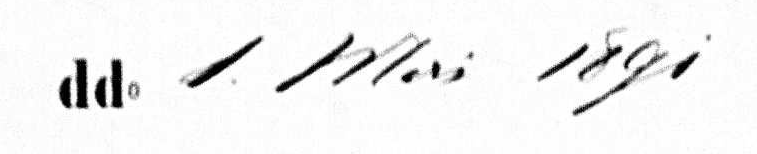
Ddo 1. Mai 1891
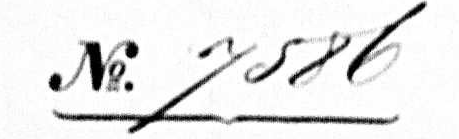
No. 7586
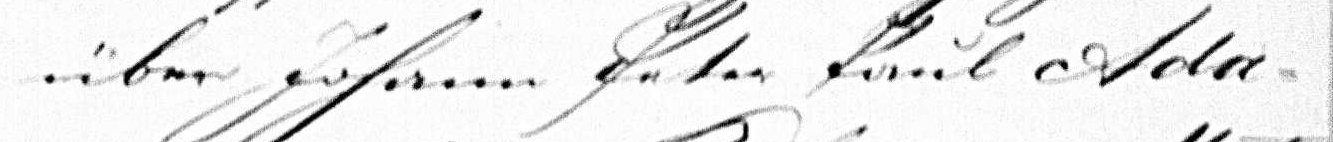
über Johann Peter Paul Ada¬
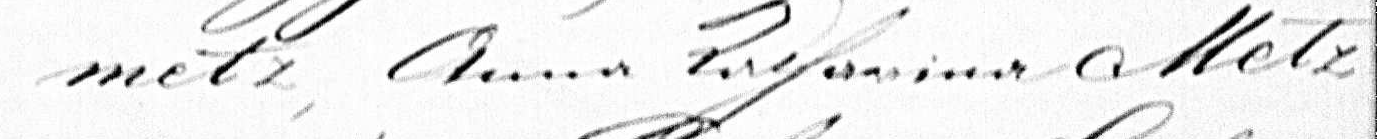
metz, Anna Katharina Metz
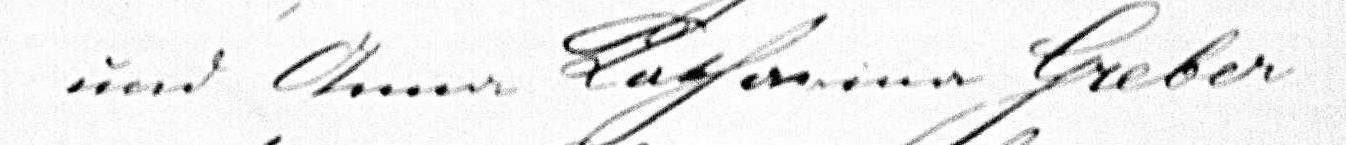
und Anna Katharina Greber
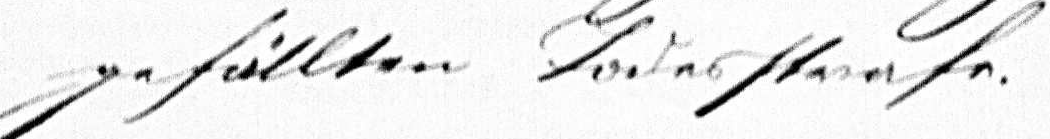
gefällten Todesstrafe.
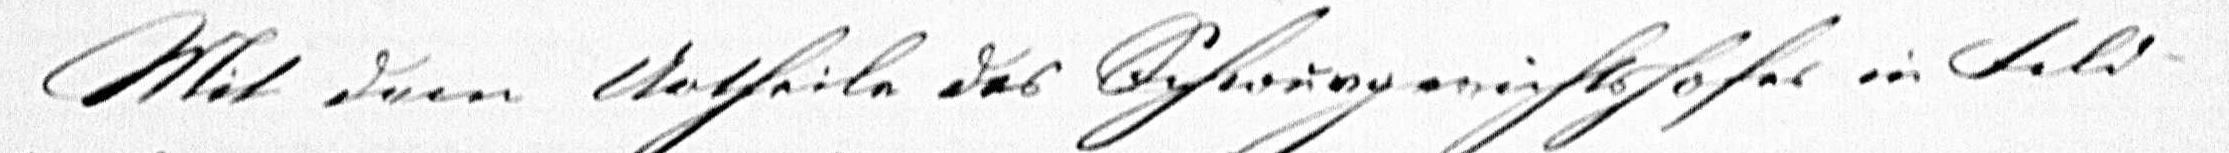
Mit dem Urtheile des Schwurgerichtshofes in Feld¬
